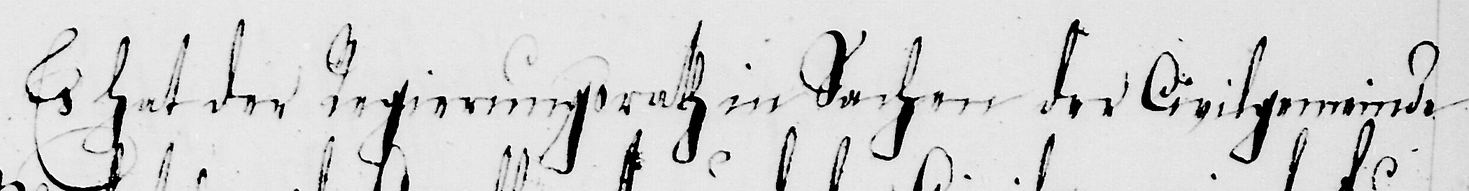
Es hat der Regierungsrath in Sachen der Civilgemeinde
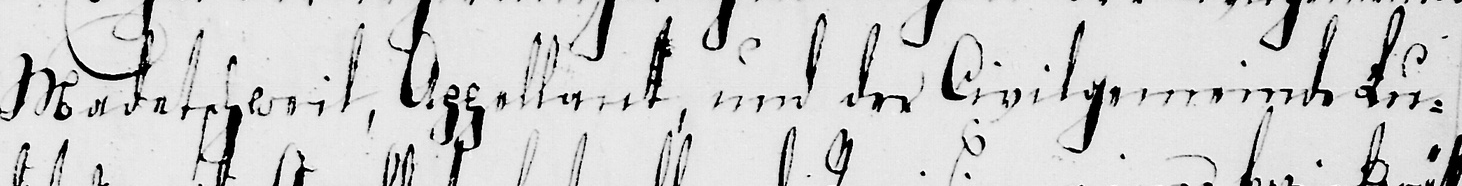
Madetschweil, Appellant, und der Civilgemeinde Lu¬
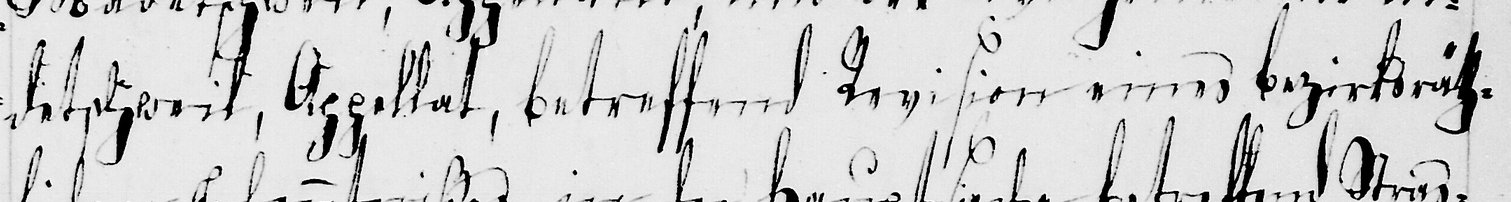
detschweil, Appellat, betreffend Revision eines Bezirksräth¬
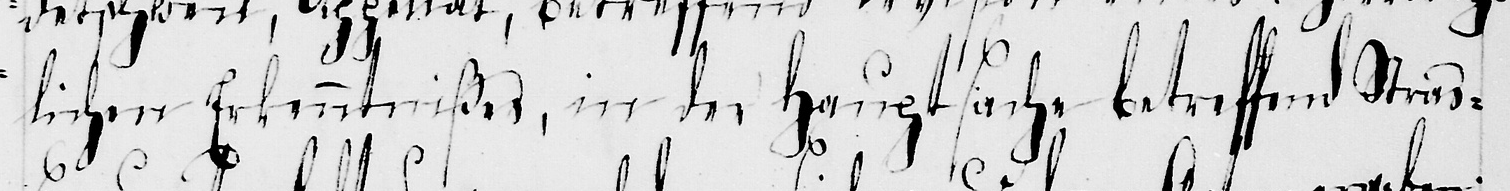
lichen Erkenntnißes, in der Hauptsache betreffend Straß¬
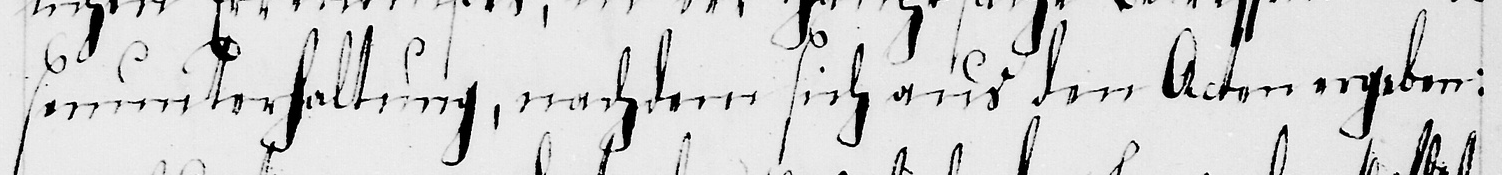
enunterhaltung, nachdem sich aus den Acten ergeben:
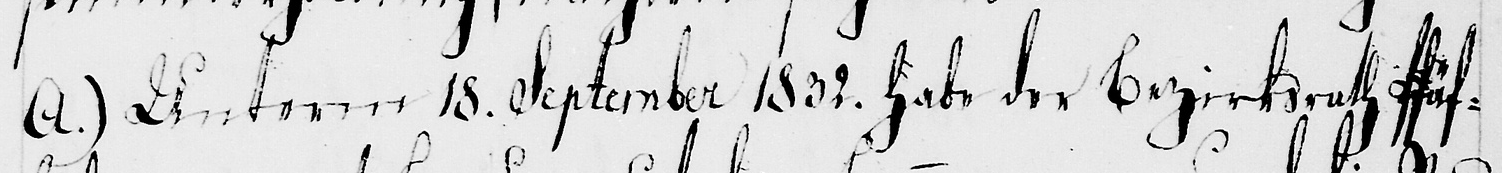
A.) Unterm 18. September 1832. habe der Bezirksrath Pfäf¬
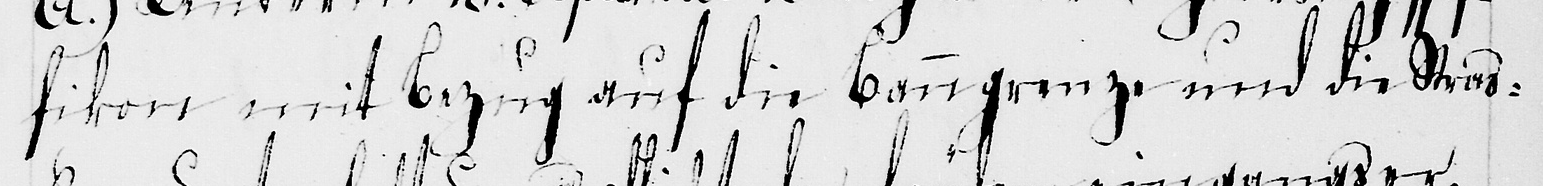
fikon mit Bezug auf die Banngrenze und die Stra¬
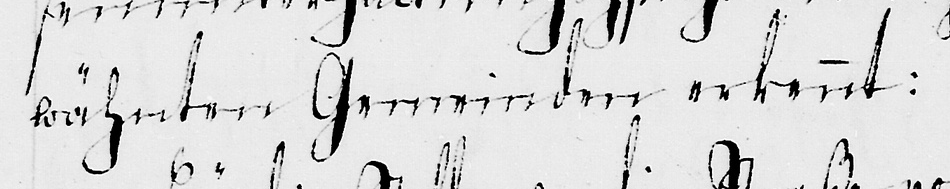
wähnten Gemeinden erkannt:
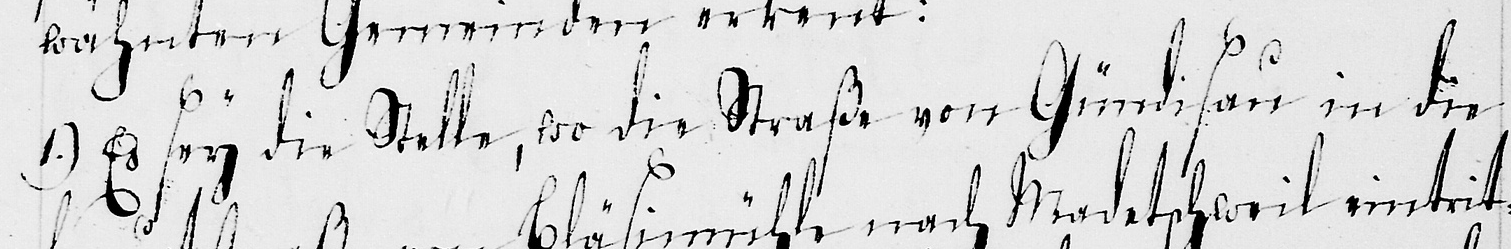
1.) Es sey die Stelle, wo die Straße von Gündisau in die
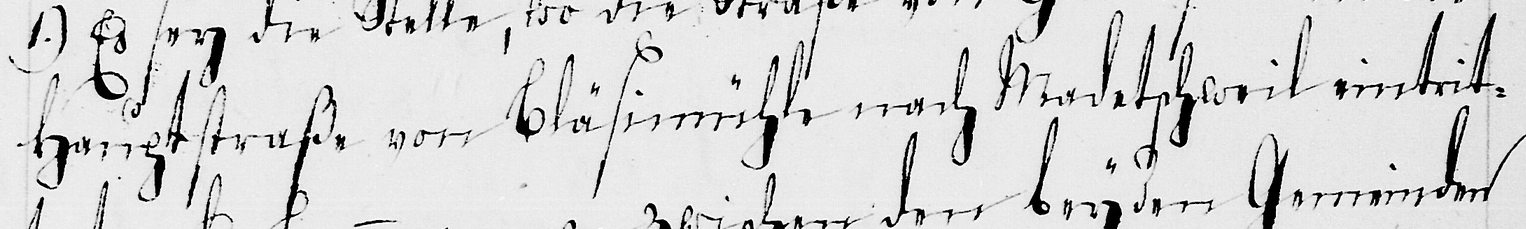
Hauptstraße von Bläsimühle nach Madetschweil eintrit¬
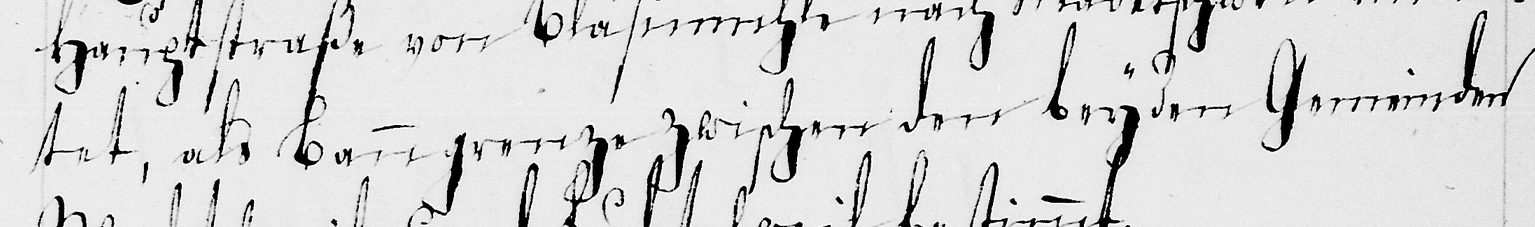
tet, als Banngrenze zwischen den beyden Gemeinden
